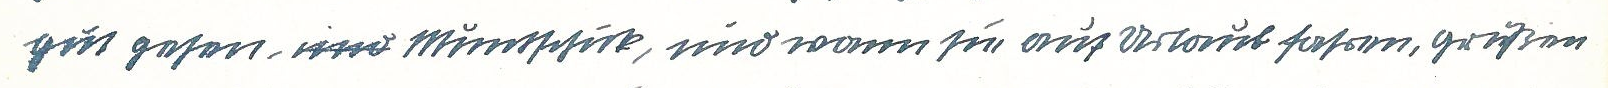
gut gehen, und, und wenn Sie auf Urlaub fahren, grüßen
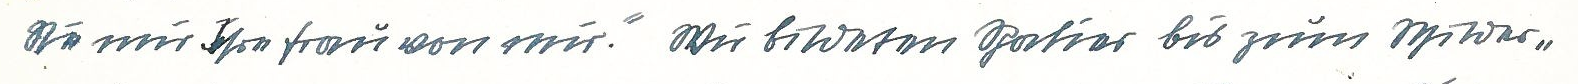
Sie mir Ihre Frau von mir.” Wir bildeten Spalier bis zum Schilder¬
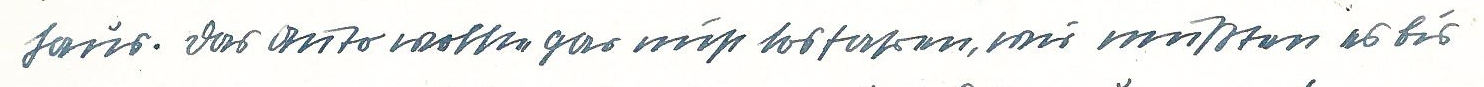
haus. Das Auto wollte gar nicht losfahren, wir mußten es bis
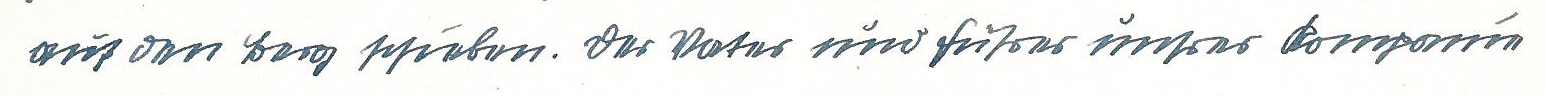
auf den Berg schieben. Der Vater und Führer unsrer Kompanie
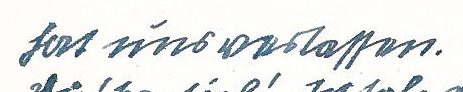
hat uns verlassen.
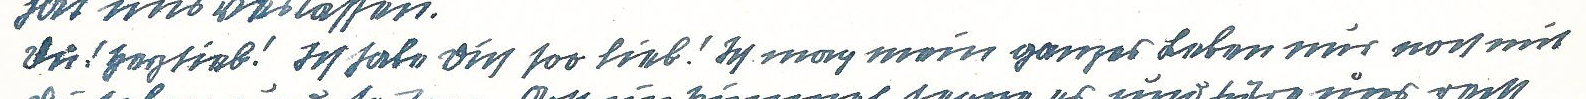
Du! Herzlieb! Ich habe Dich soo lieb! Ich mag mein ganzes Leben nur noch mit
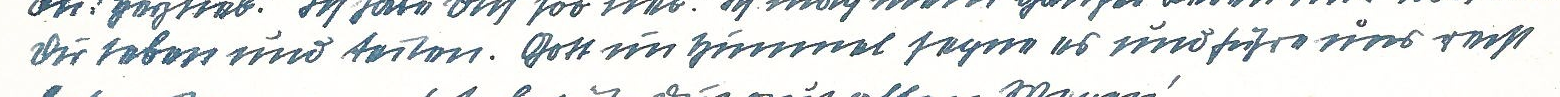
Dir leben und teilen. Gott im Himmel segne es und führe uns recht
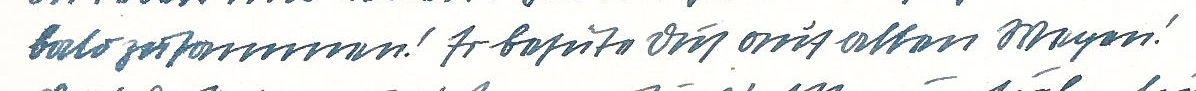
bald zusammen! Er behüte Dich auf allen Wegen!
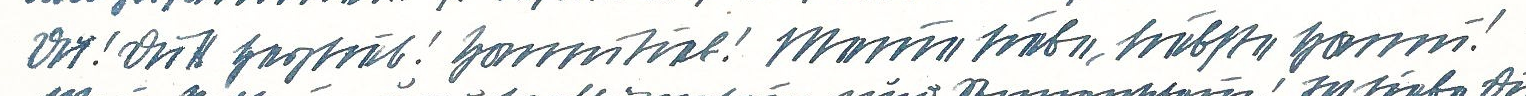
Du! Du!! Herzlieb! lieb! Meine liebe, liebste!
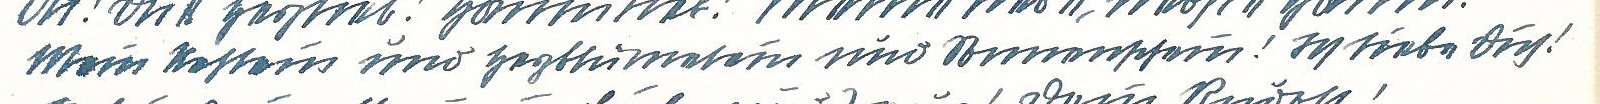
Mein Rehlein und Herzblümelein und Sonnenschein! Ich liebe Dich!
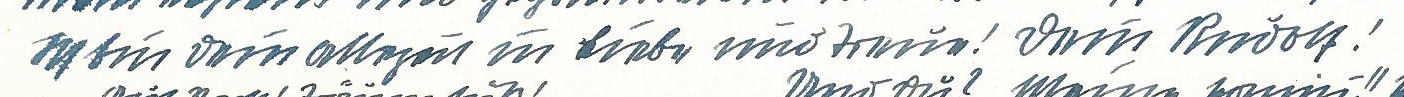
Ich bin Dein allzeit in Liebe und Treue! Dein Rudolf!
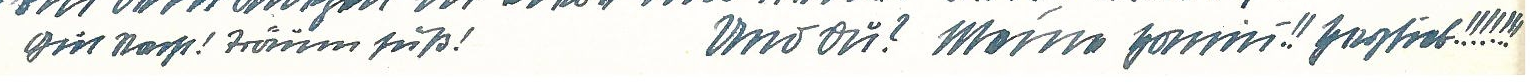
Gut Nacht! Träum süß! Und Du? Meine!! Herzlieb!!!!!!!
